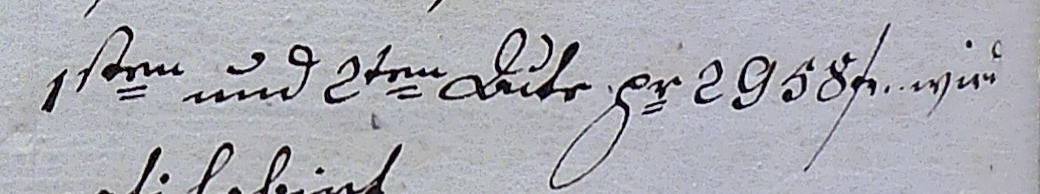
1ste͇n und 2te͇n Acte pr͇ 2958fr. wird
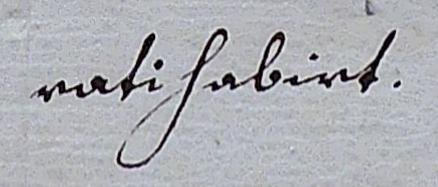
ratihabirt.
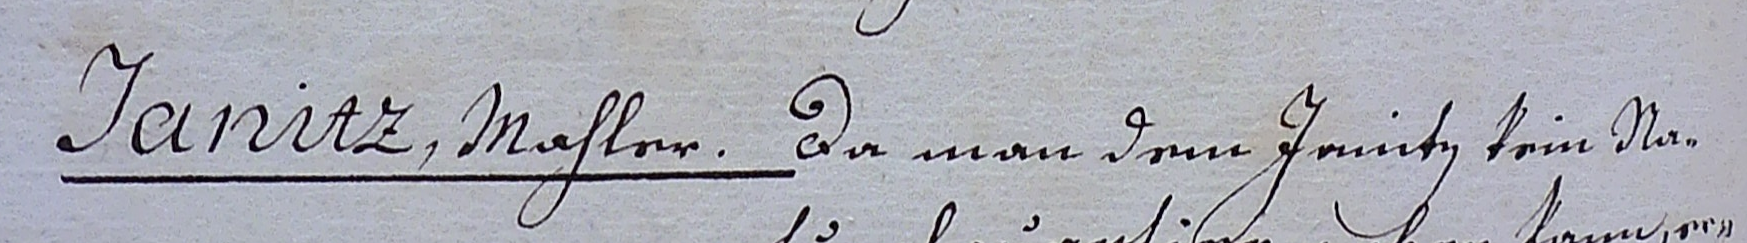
Janitz, Mahler. Da man dem Janitz kein Na¬
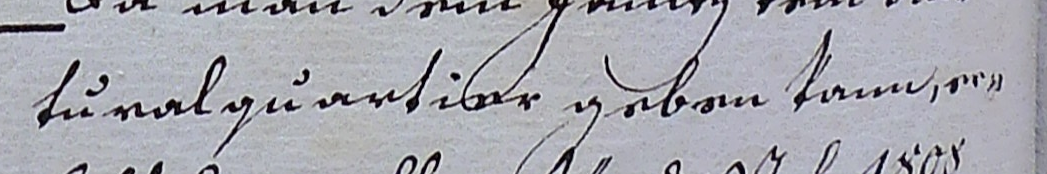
turalquartier geben kann, er¬
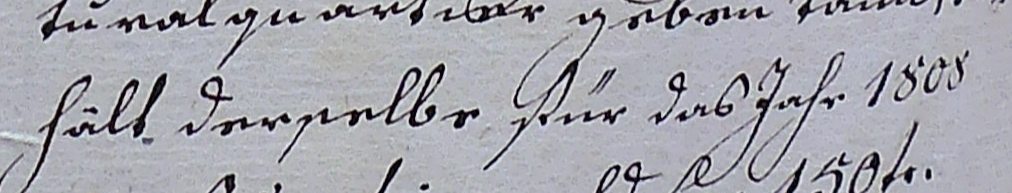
hält derselbe für das Jahr 1808
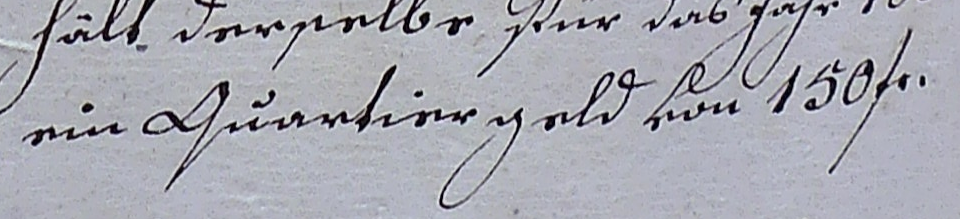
ein Quartiergeld von 150fr.
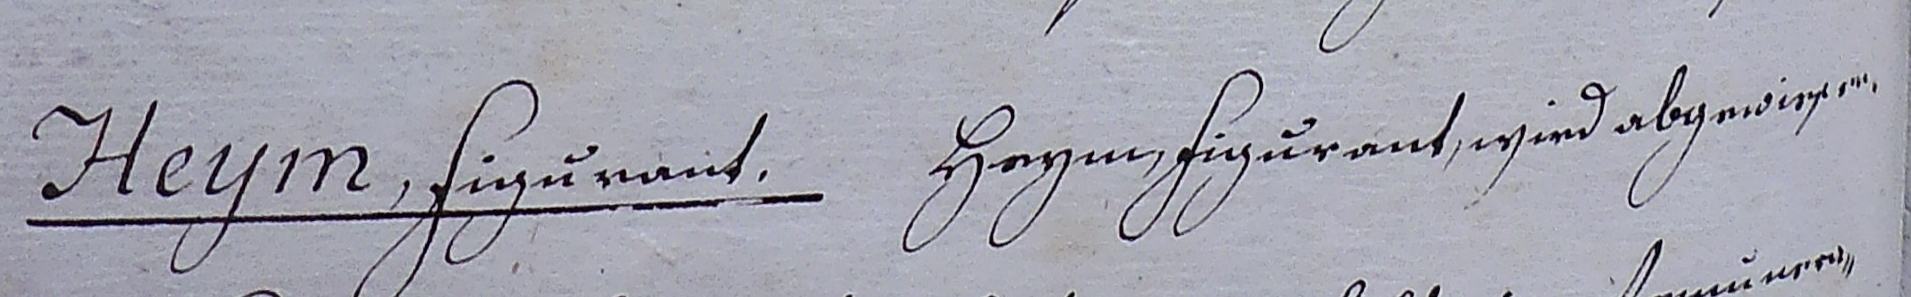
Heym, Figurant. Heym, Figurant, wird abgewiesen.
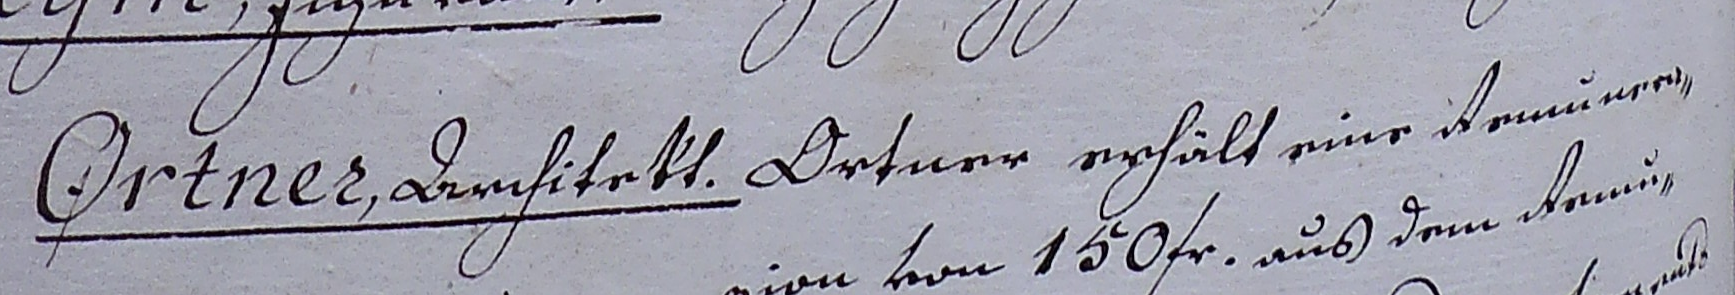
Ortner, Architekt. Ortner erhält eine Remunera¬
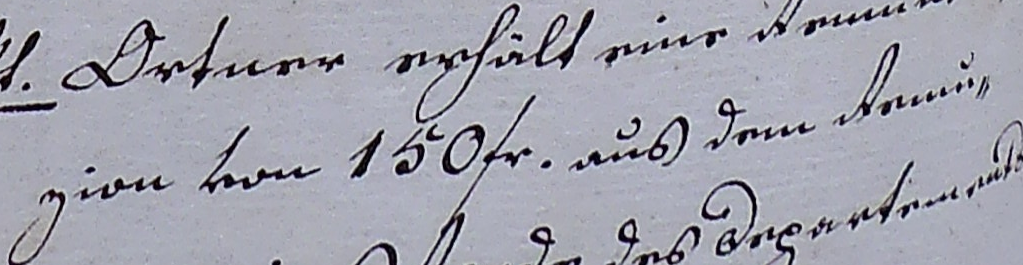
zion von 150fr. aus dem Remu¬
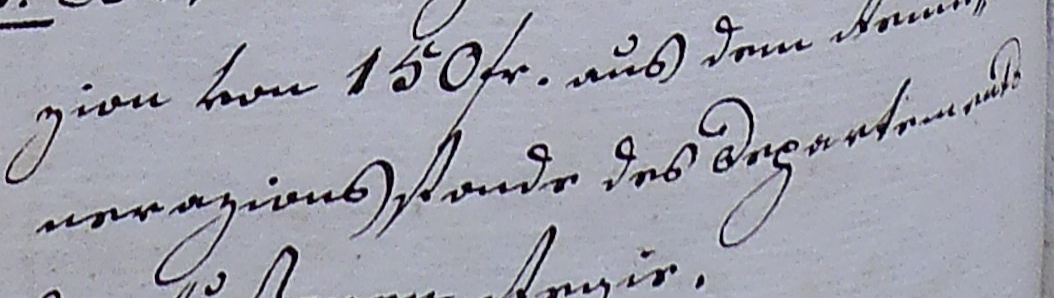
nerazionsfonde des Departments
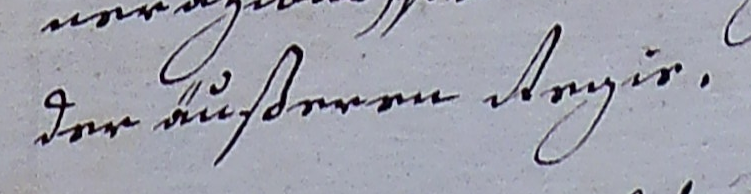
der äußeren Regie.
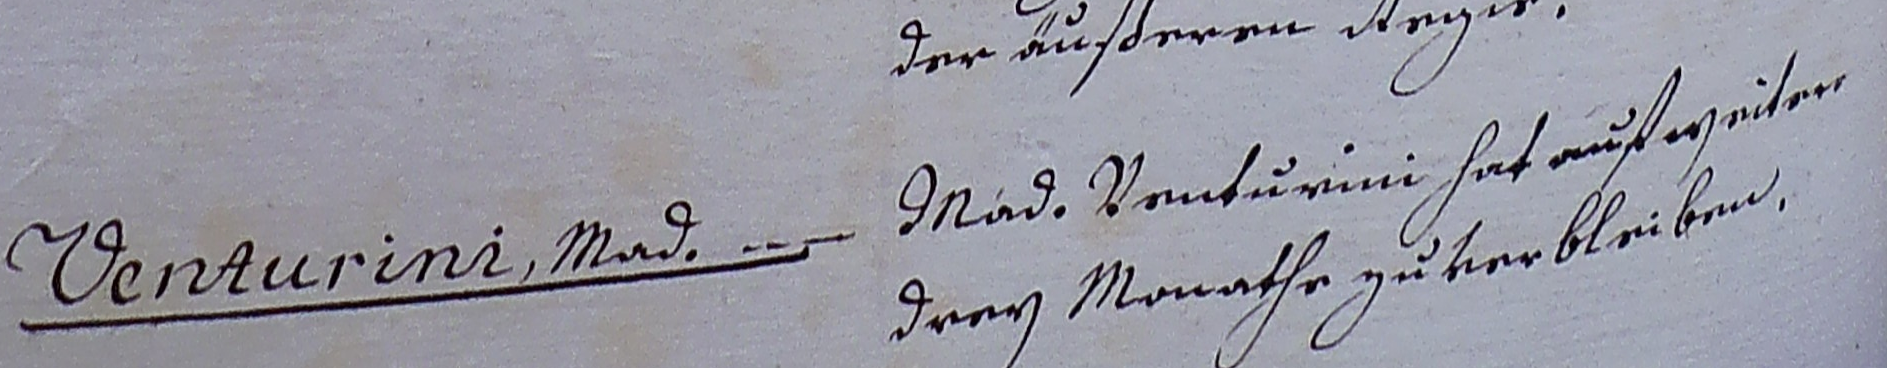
Venturini, Mad. .. __ Mad. Venturini hat auf weitere
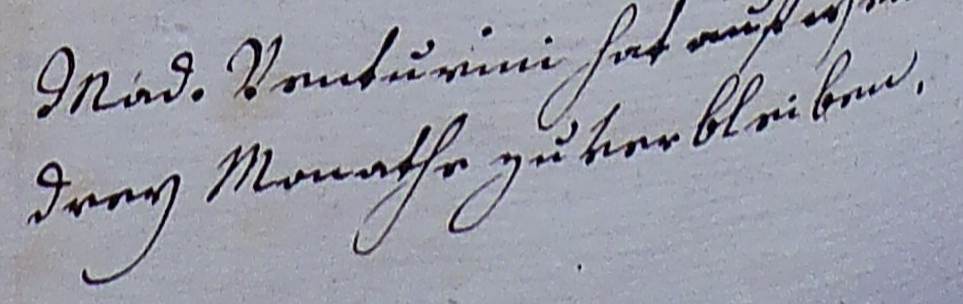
drey Monathe zuverbleiben.
